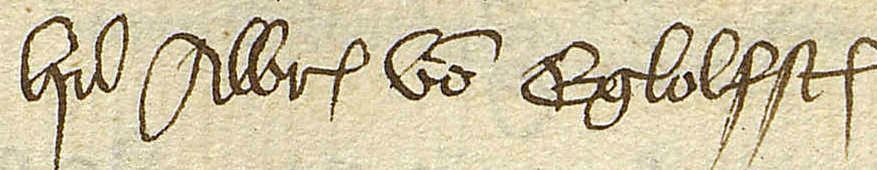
hn* Albr* vo* Eglolfſt*
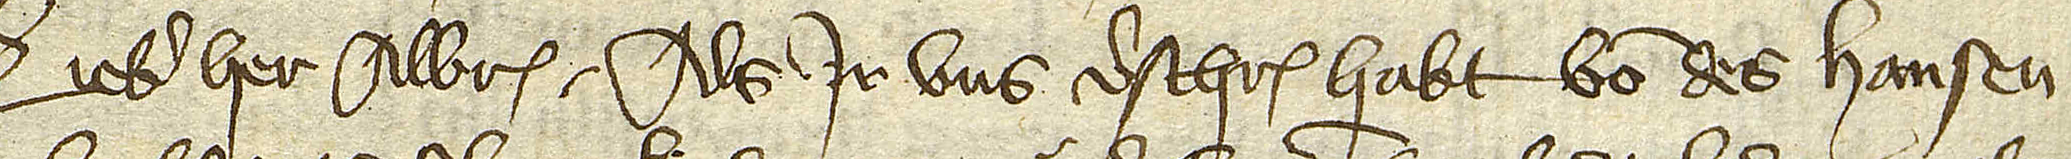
Lieb* her Albr* / Als Ir vns v*ſchr* habt vo* des hanſen
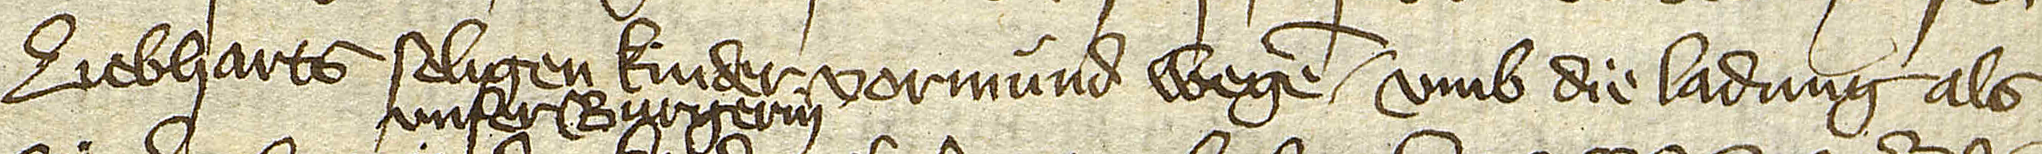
Liebharts ſeligen kinder vormünd wege* / vmb die ladung als
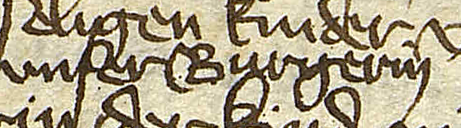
vnſer Burgerin
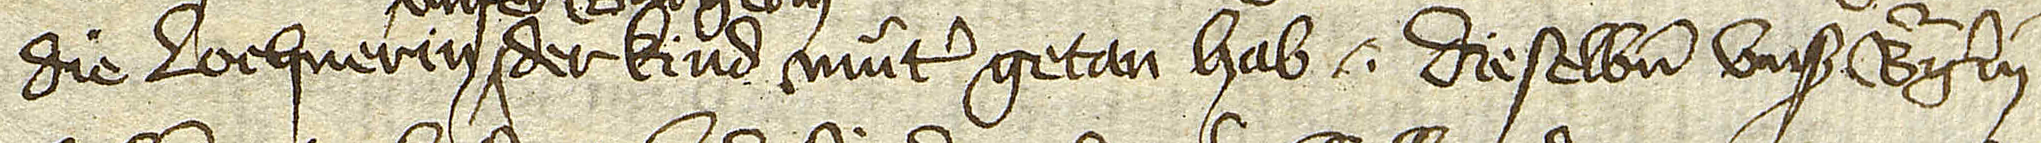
die Lochnerin der kind müt* getan hab / . dieſelbn* vnſ* B*g*in
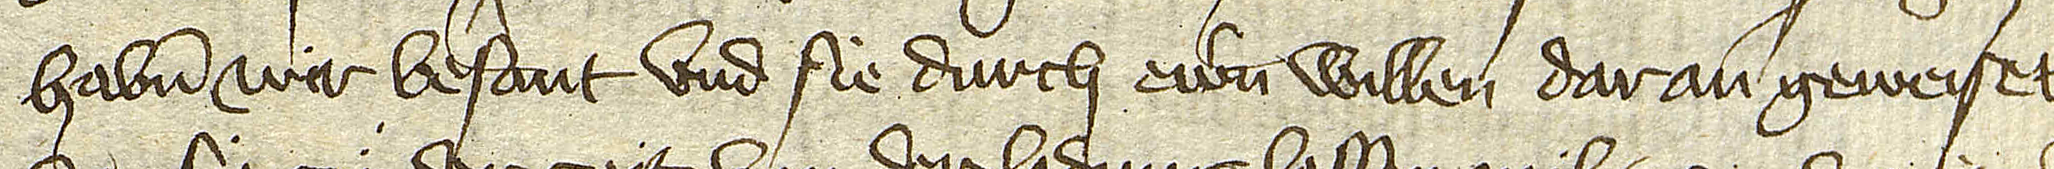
habn* wir beſant vnd ſie durch ew*n willen daran geweiſet
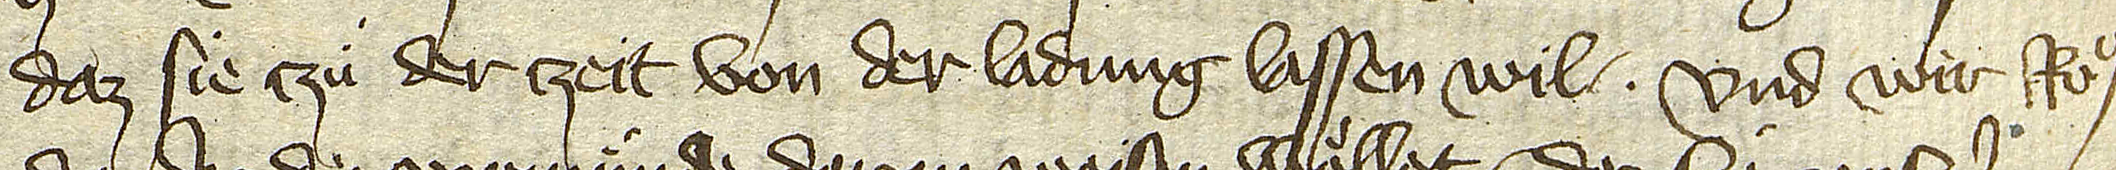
daʒ ſie cʒü der cʒeit von der ladung laſſen wil / . vnd wir Ro*
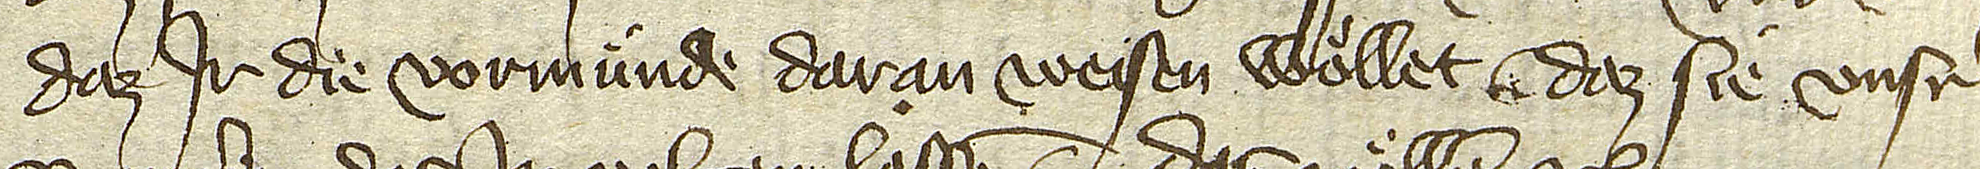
daʒ Ir die vormünde daran weiſen wöllet / daʒ ſie vnſr*
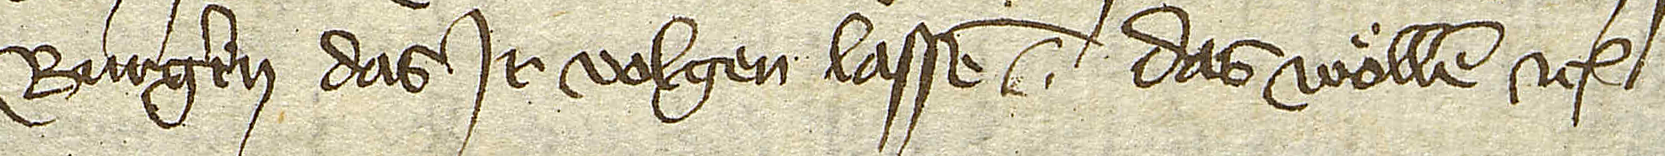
Burg*in das Ir volgen laſſe* / . das wölle* ec*
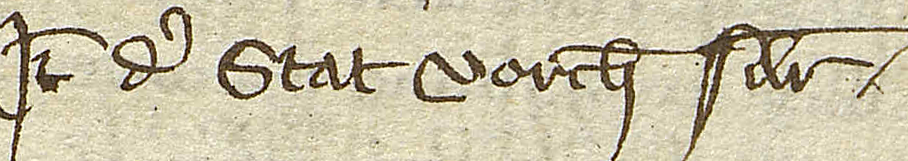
It d* Stat vorch* ſilr* /
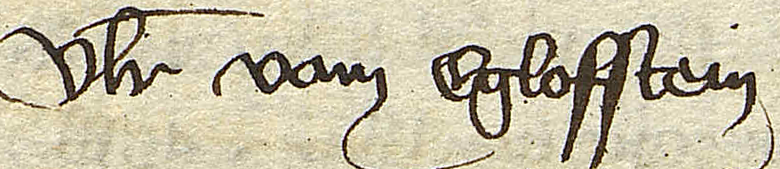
vlr* vom Eglofſtein
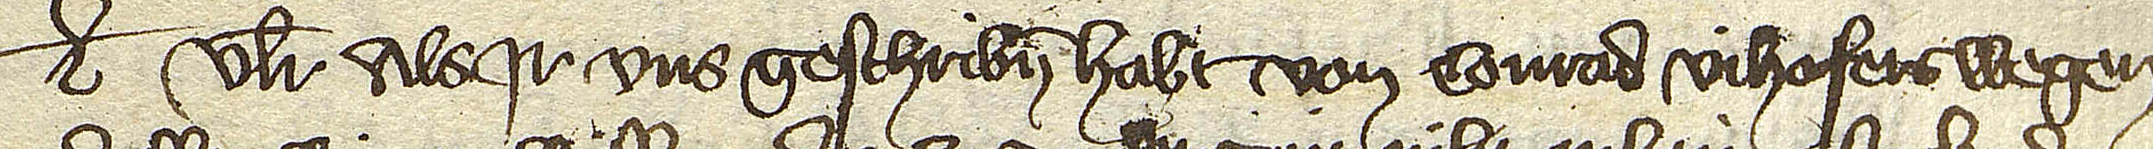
L* vlr* Als Ir vns geſchribn* habt von Conrad vihofers wegen
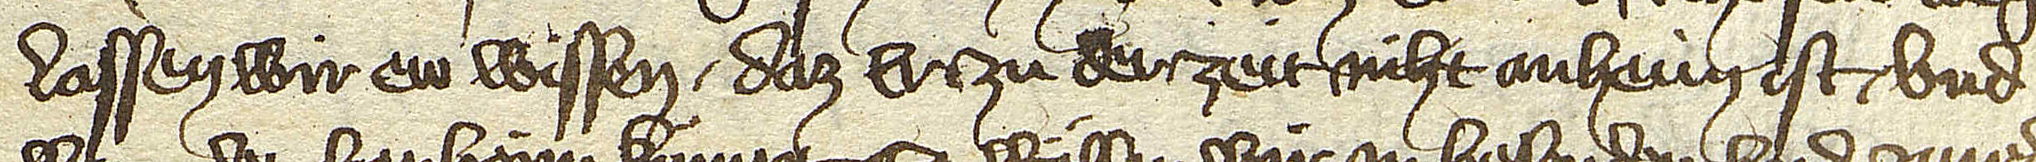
laſſen wir ew wiſſen / daʒ Er cʒu dercʒeit niht anheim iſt / vnd
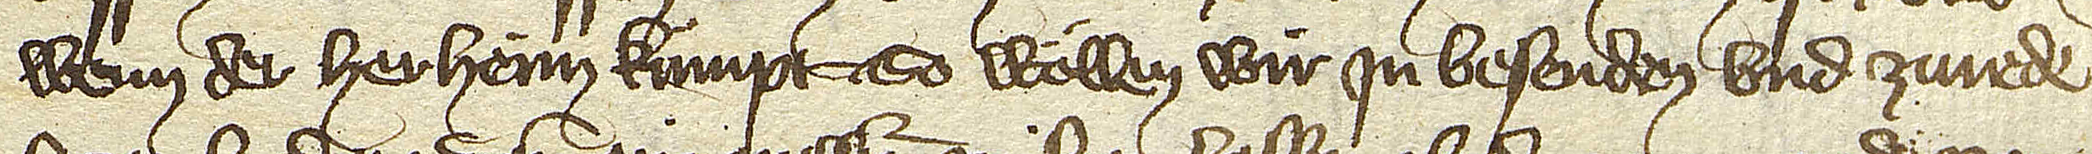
wenn der herheim kümpt / So wöllen wir In beſenden vnd cʒurede
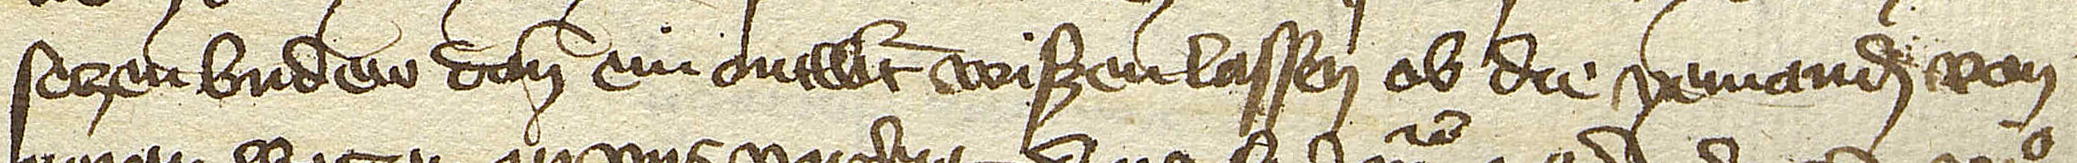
ſecʒen vnd ew dan* ein antwt* wiſʒen laſſen ob die yemand* von
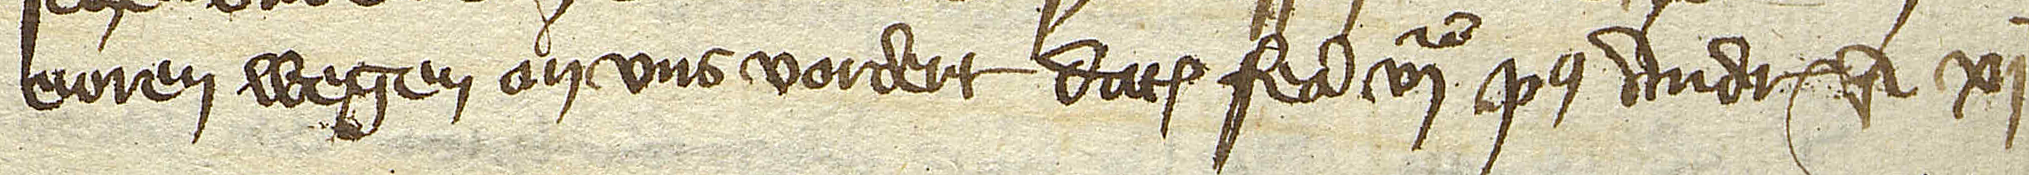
ewren wegen an vns vordert dat* fea* vi* p* Andr* A xi*
